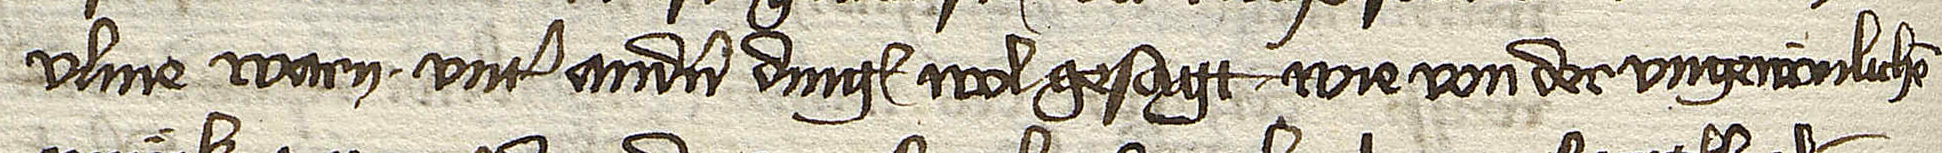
vlme warn . vnt* andn* ding* wol geſagt / wie von der vngewönliche*
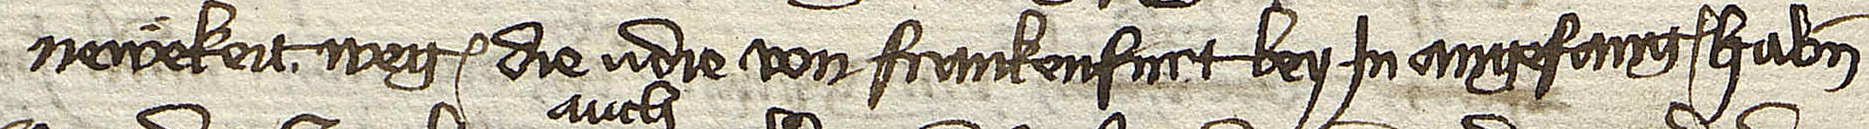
neẅekeit weg* die ~ die von frankenfurt bey In angefang* habn*
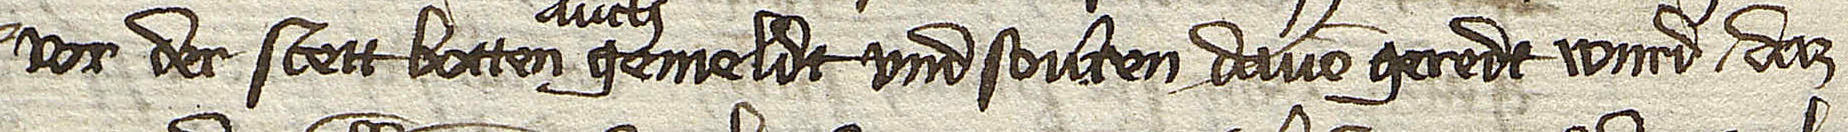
vor der ſtett botten gemeldt vnd ſou*ren dauo* geredt wurd / daʒ
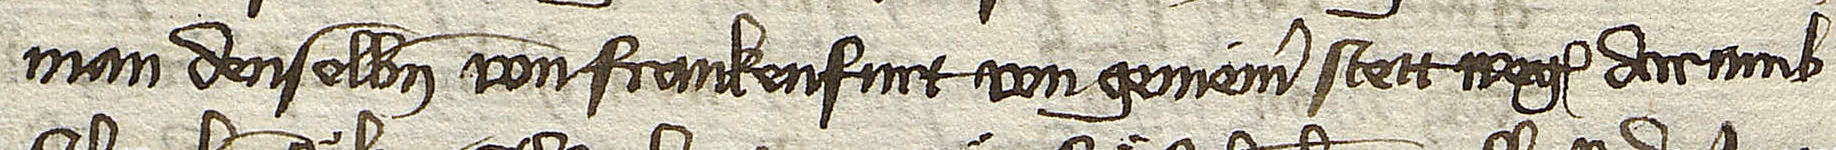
man denſelbn* von frankenfurt von gemein* ſtett weg* darumb
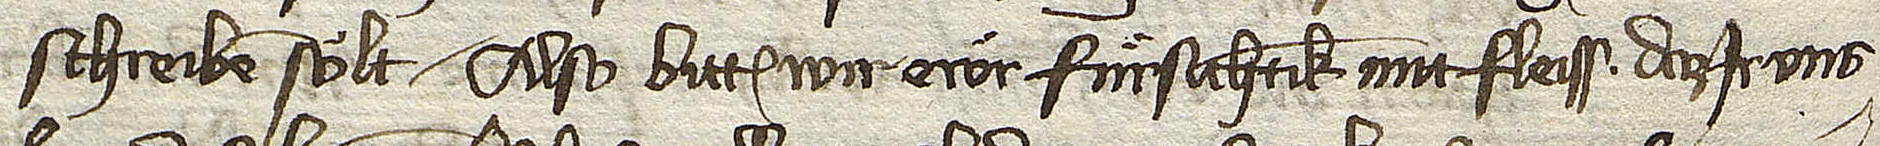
ſchreibe* ſölt / Alſo bitt* wir eẅr fürſichtik* mit fleiſſ . daʒ Ir vns
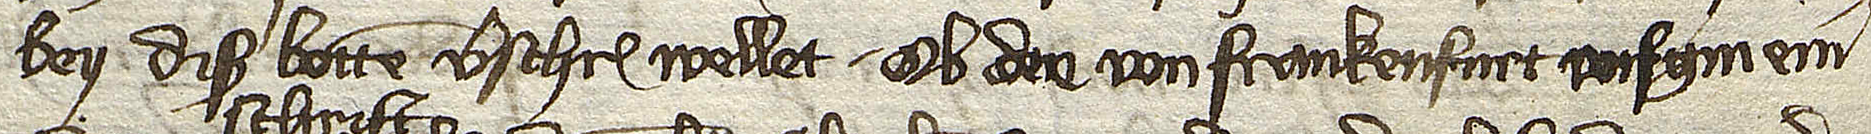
bey diſ* botte* v*ſchr* wellet / Ob die von frankenfurt vorfg%% ein*
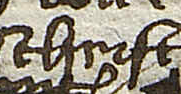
ſchrift
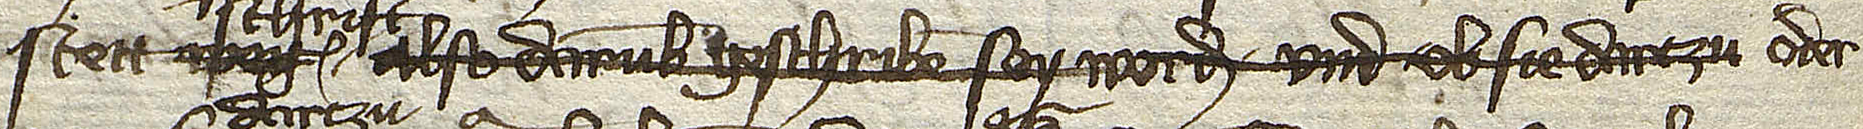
ſtett weg* / alſo darub* geſchribe* ſey word* / vnd / ob ſie darcʒu oder
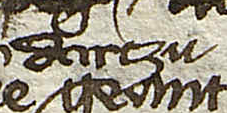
darcʒu
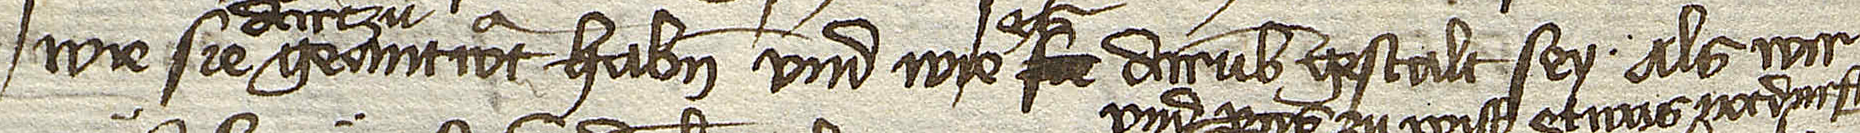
wie ſie geantw*t habn* vnd wie ſie darub* geſtalt ſey . als wir
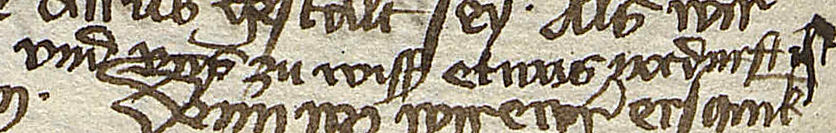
vnd vns ʒu wiſſ* etwas notdurft iſt
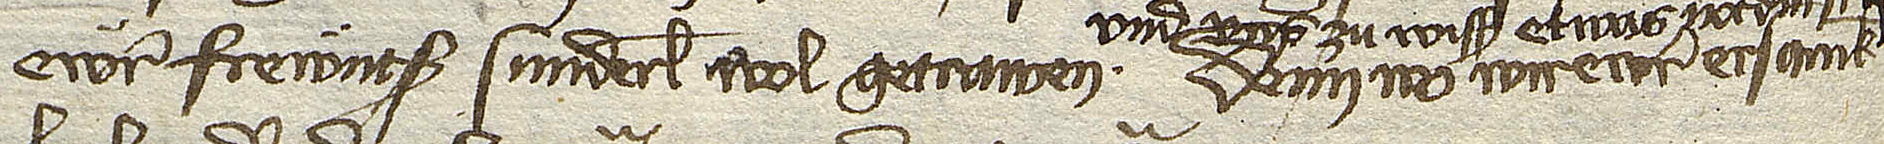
eẅr* freẅntſ* ſunderl* wol getrawen . Denn wo wir ewr* erſamk*
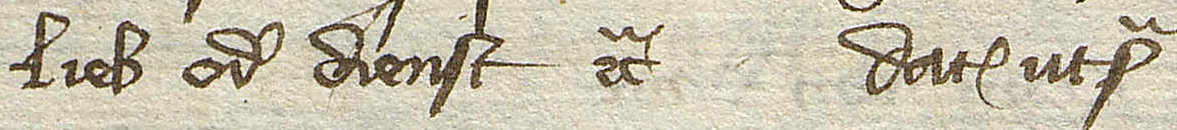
lieb od* dienſt ec* Dat* ut ſ*
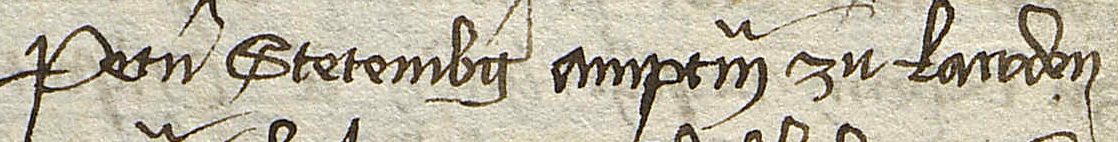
Petn* Stetemb*g amptm* ʒu Lawden
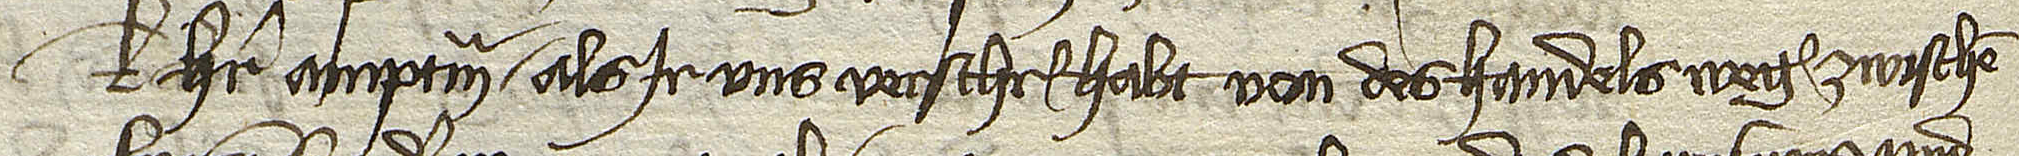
L* hr* amptm* / als Ir vns verſchr* habt von des handels weg* ʒwiſche*
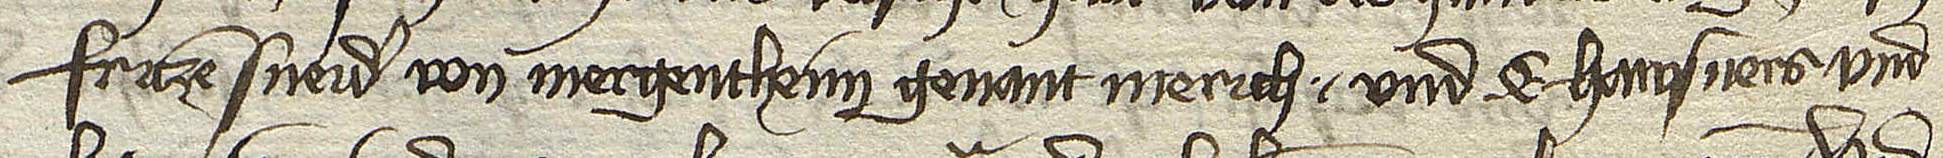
fricʒe* ſneid* von mergentheim genant merich . / vnd . C . hawſners vnd
